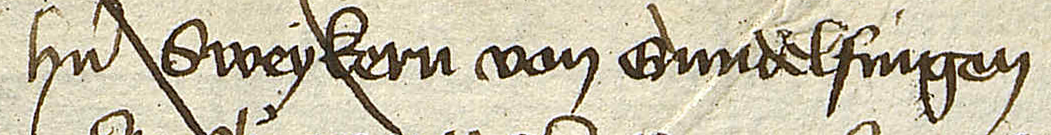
H*n Sweykern von Gundelfingen
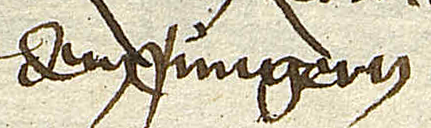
dem Iüngern
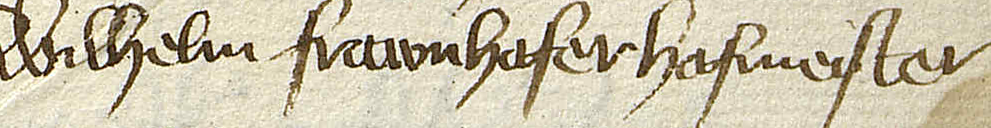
Wilhelm frawnhofer hofmeiſter
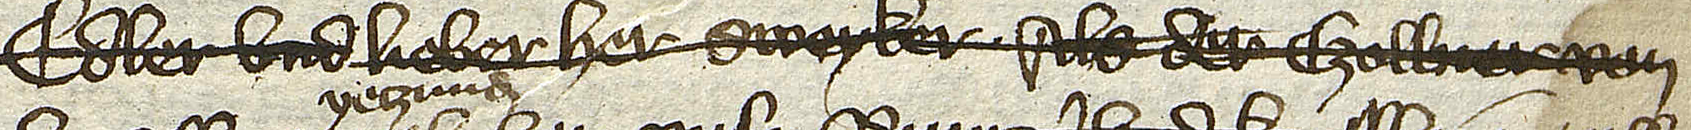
Edler vnd lieber her Sweyker . Als der Cʒollner von
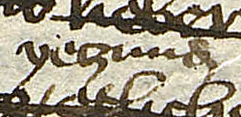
yecʒund*
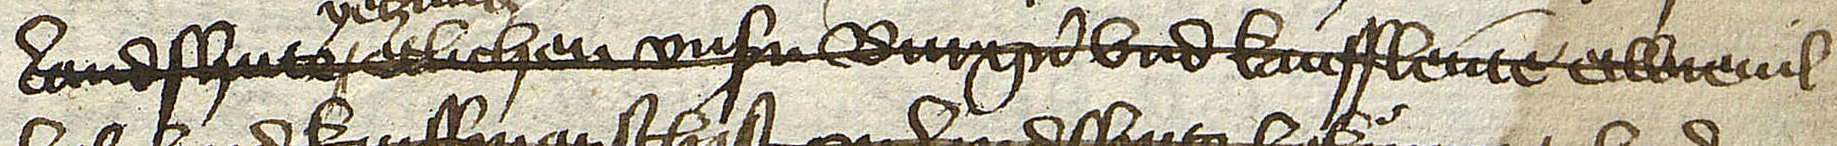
landſhute etlichen vnſ*n Burg*n vnd kauffleute* etwieuil
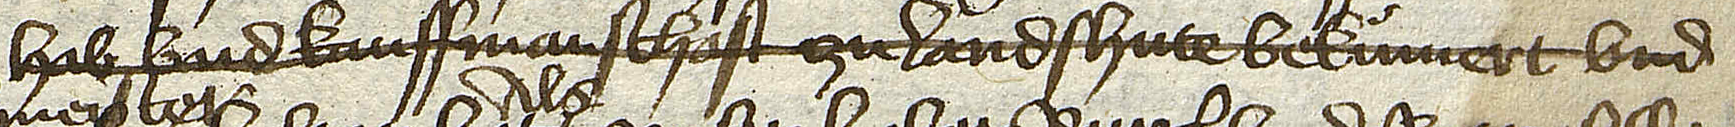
hab vnd kauffmanſchaft cʒu landſhute bekümert vnd
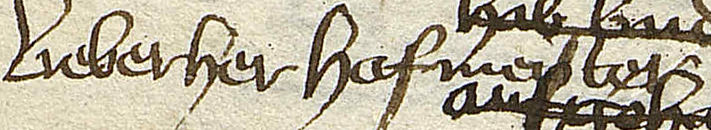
Lieber her hofmeiſter
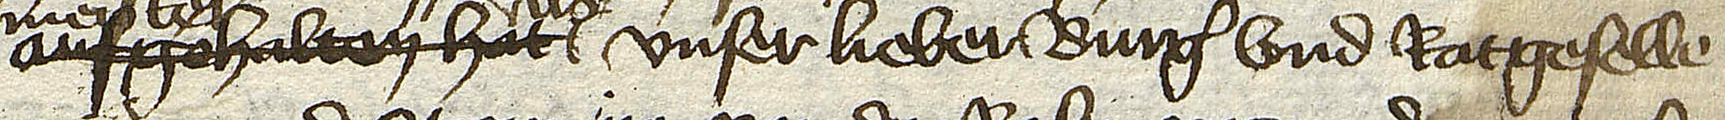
aufgehalten hat vnſer lieber Burg* vnd Ratgeſelle
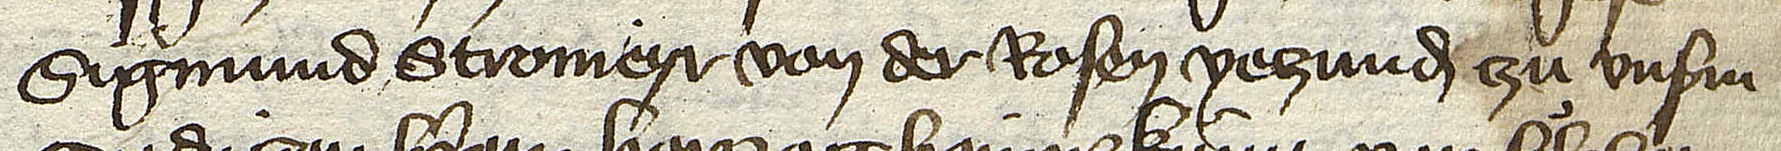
Sigmund Stromeyr von der Roſen yecʒund* cʒu vnſ*m
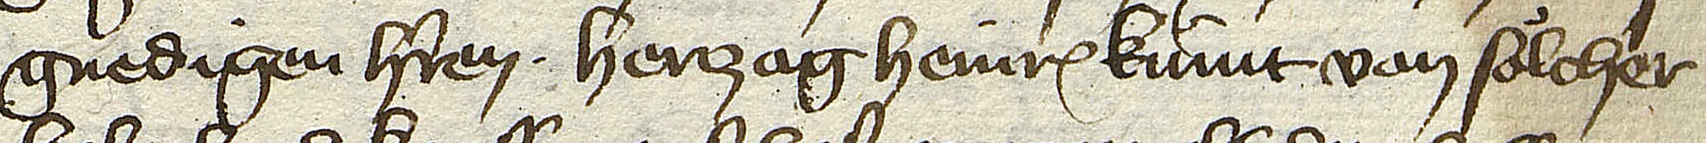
gnedigen h*ren . hercʒog heinr* kümt von ſölcher
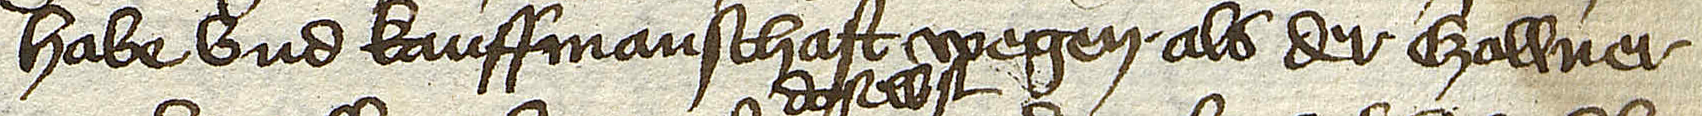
habe vnd kauffmanſchaft wegen . als der Cʒollner
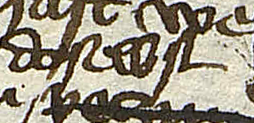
daſelbſt
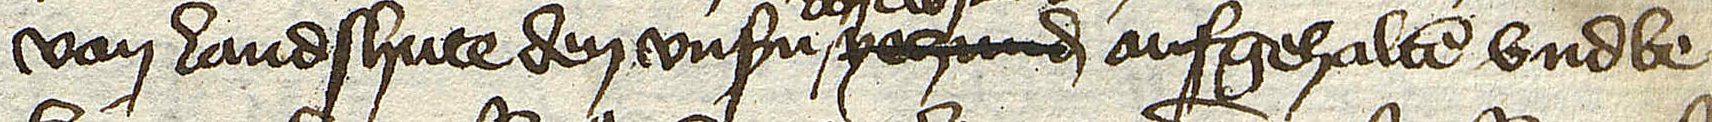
von landſhute den vnſ*n yecʒund* aufgehalte* vnd be -
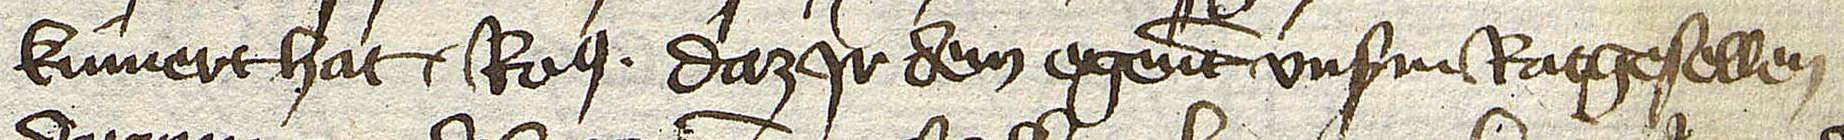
kümert hat / Ro* . daʒ Ir dem egent* vnſ*m Ratgeſellen
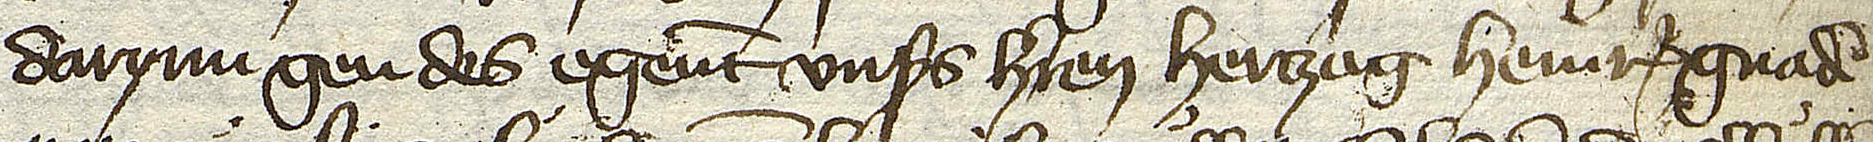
darynn gen des egent* vnſ*s h*ren hercʒog heinr* gnad*
